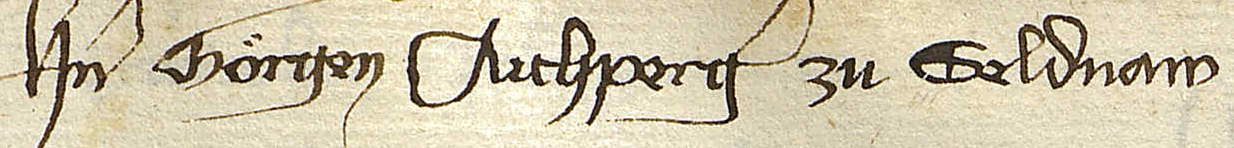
H*n Görgen Aichperg* ʒu Seldnaw
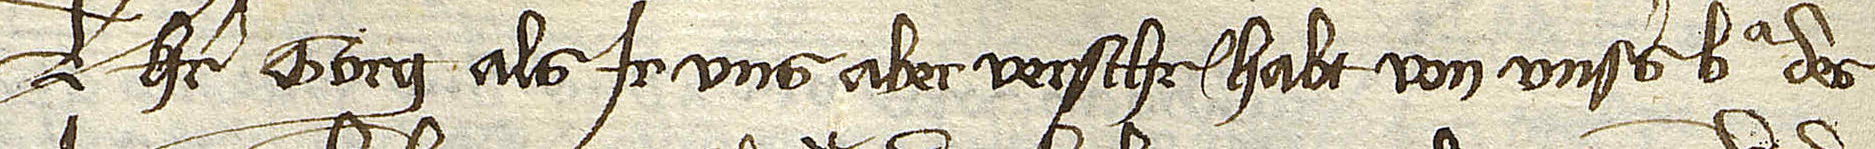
L* h*r Görg . als Ir vns aber verſchr* habt von vnſ*s b* des
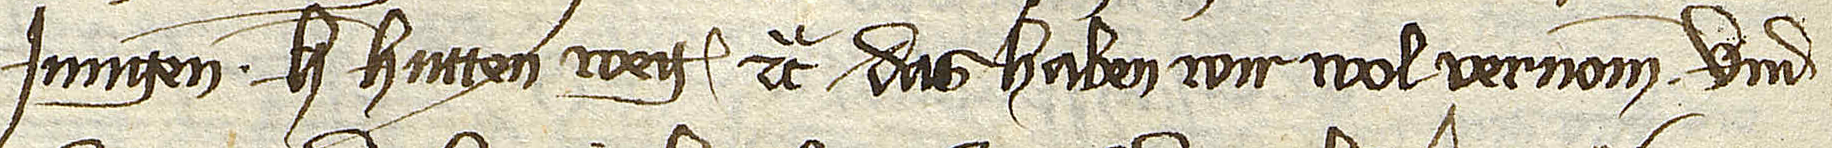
Iungen . H* Hutten weg* ec* / das haben wir wol vernom* / Vnd
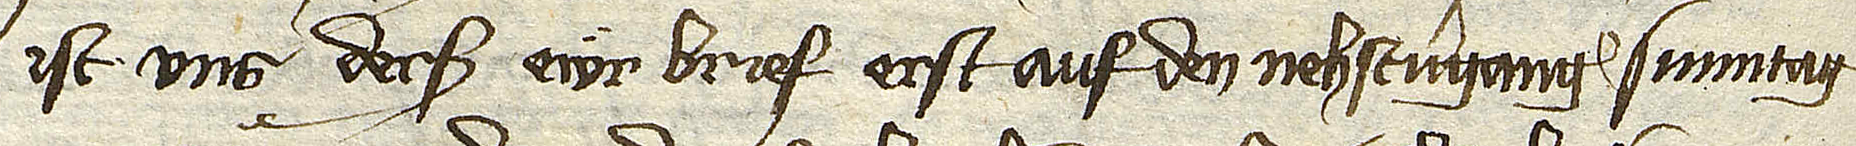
iſt . vns derſ* ewr brief erſt auf den nehſtu*gang* ſunntag
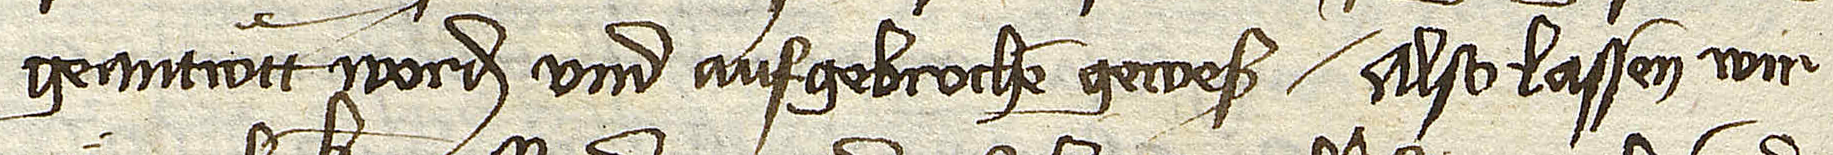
geantw*tt word* vnd aufgebroche* geweſ* / Alſo laſſen wir
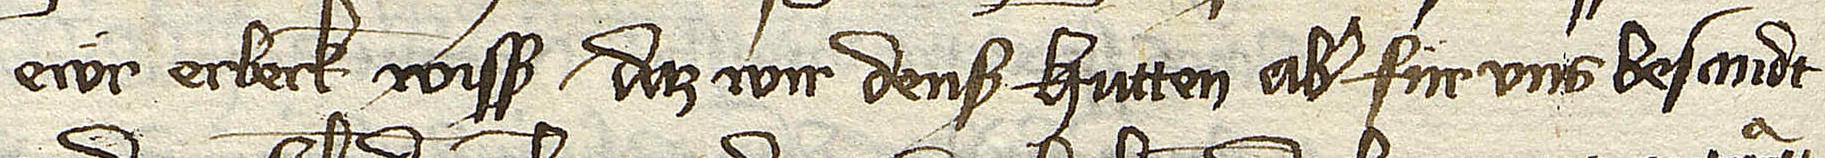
ewr erberk* wiſſ* / daʒ wir denſ* Hutten ab* für vns beſandt
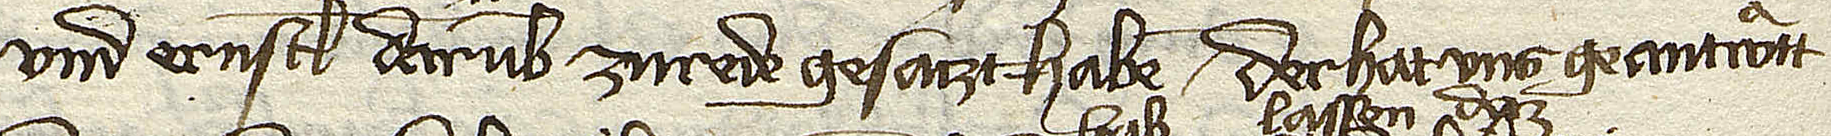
vnd ernſtl* daru*b ʒurede geſacʒt habe* / Der hat vns geantw*tt
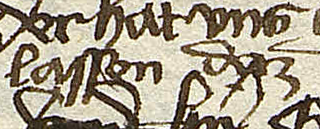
laſſen daʒ
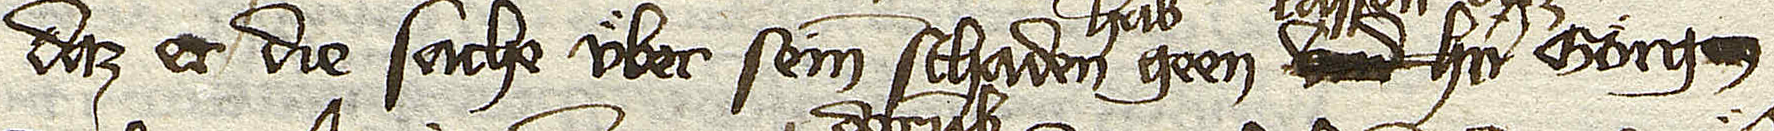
daʒ er die ſache v̈ber ſein* ſchaden geen Vnd h*n Görgen
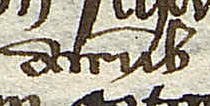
daru*b
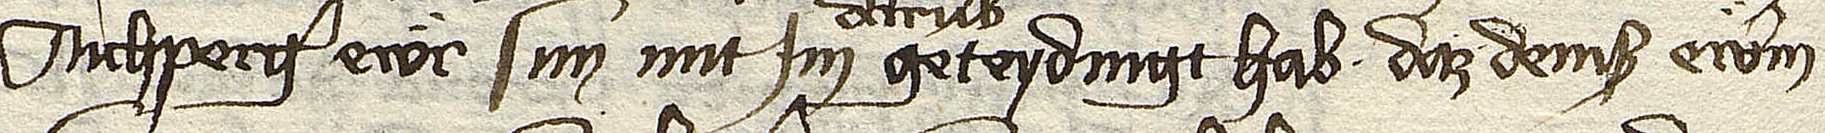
Aichperg* ewr ſun mit Im geteydingt hab . daʒ demſ* ew*m
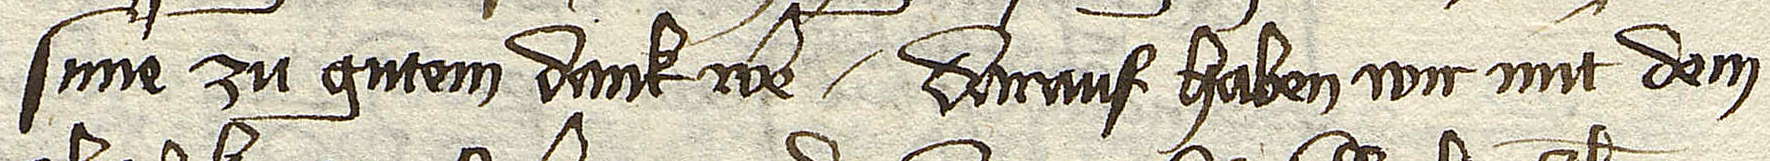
ſune ʒu gutem dank we* / Darauf haben wir mit dem
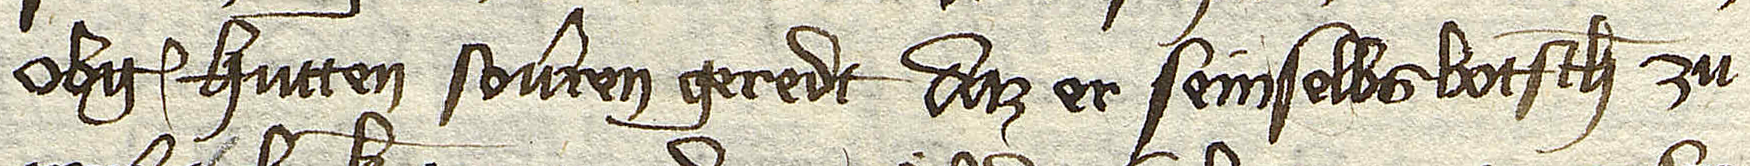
obg* hutten ſou*ren geredt daʒ er ſeinſelbs botſch* ʒu
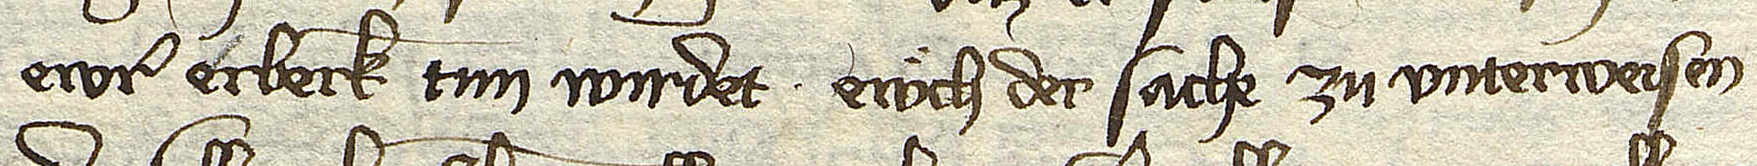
ew*r erberk* tun wirdet . ewch der ſache ʒu vnterweiſen
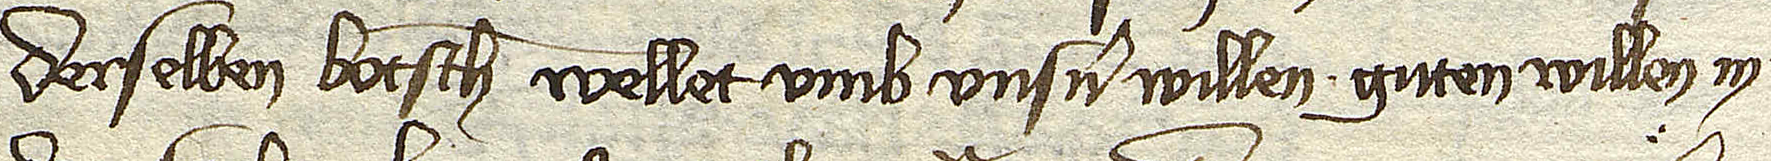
derſelben botſch* wellet vmb vnſ*n willen . guten willen in
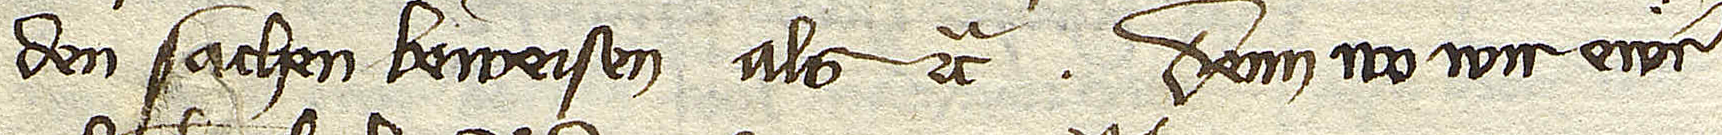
den ſachen beweiſen als ec* . Denn wo wir ew*r
